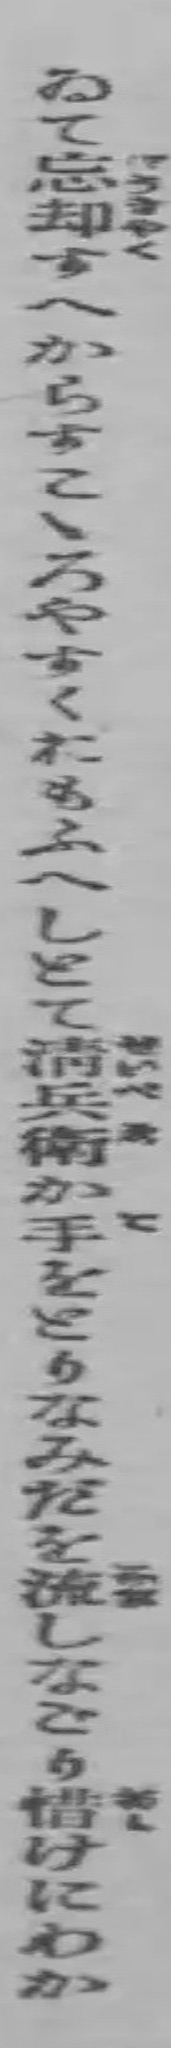ゐて忘却すへからすこゝろやすくおもふへしとて清兵衛か手をとりなみだを流しなごり惜けにわか
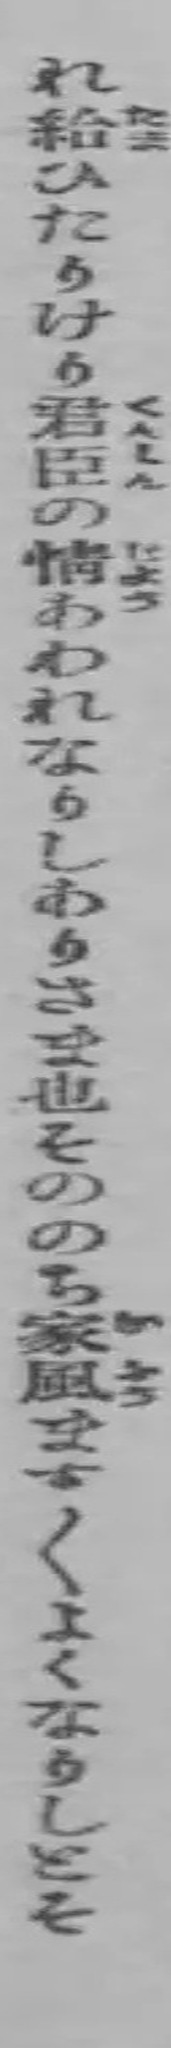れ給ひたりけり君臣の情あわれなりしありさま也そののち家風ます〳〵よくなりしとそ
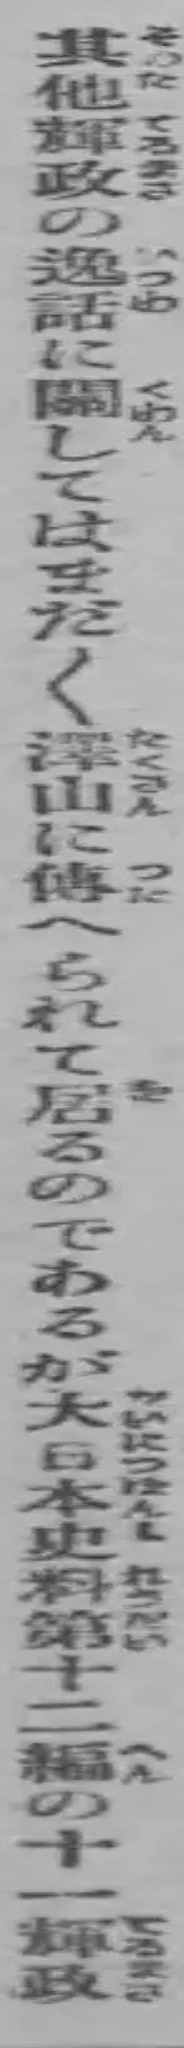矮舞其他輝政の逸話に関してはまだ〳〵沢山に伝へられて居るのであるが大日本史料第十二編の十一輝政
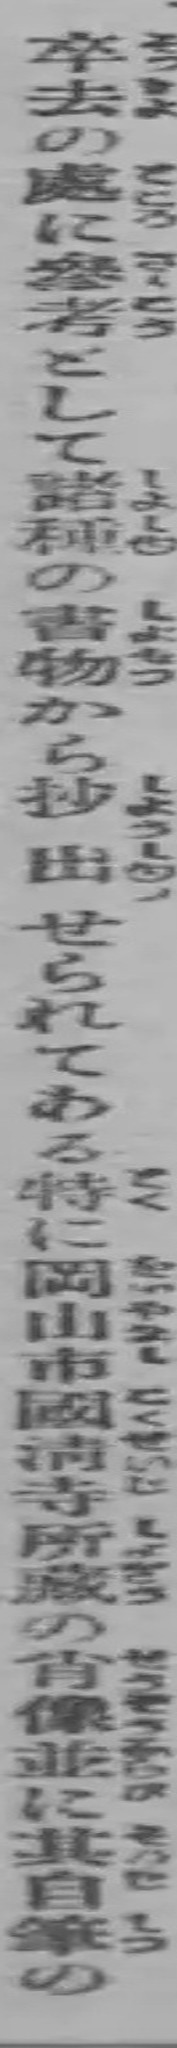卒去の処に参考として諸種の書物からも抄出せられてある特に岡山市国清寺所蔵の肖像並に其自筆の

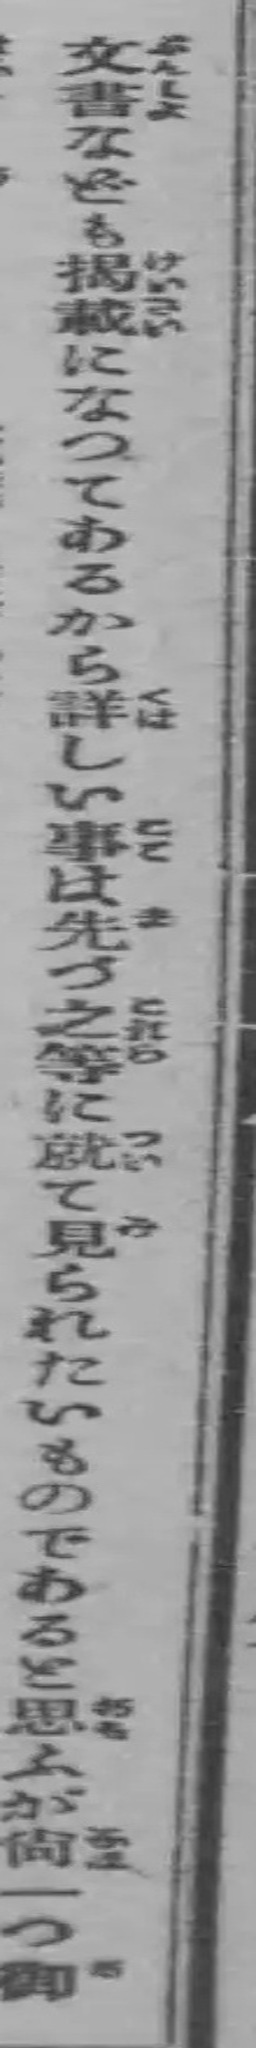文書なども掲載になつてあるから詳しい事は先づ之等に就て見られたいものであると思ふが尚一つ御
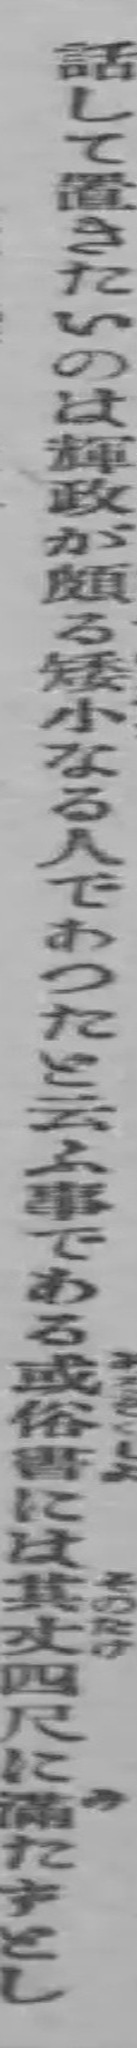話して置きたいのは輝政が頗る矮小なる人であつたと云ふ事である或俗書には其丈四尺に満たずとし
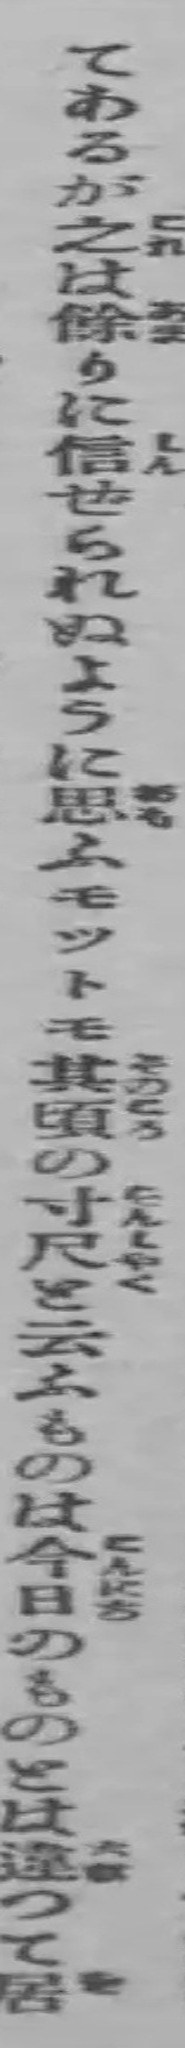てあるが之は余りに信ぜられぬように思ふモツトモ其頃の寸尺と云ふものは今日のものとは違つて居
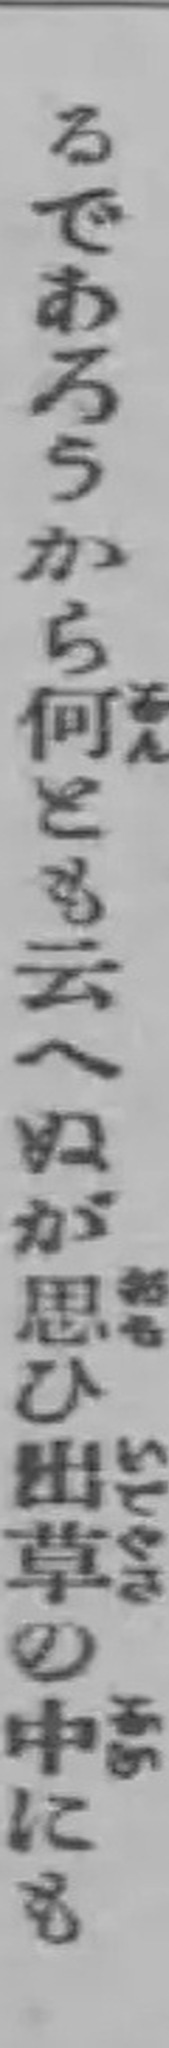るであろうから何とも云へぬが思ひ出草の中にも
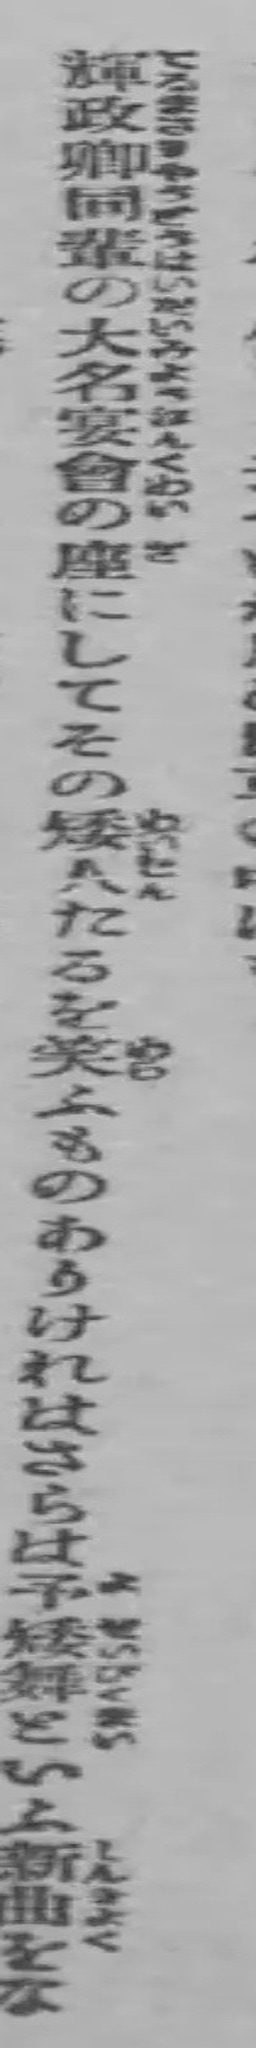輝政卿同輩の大名宴会の座にしてその矮人たるを笑ふものありけれはさらは予矮舞といふ新曲をな
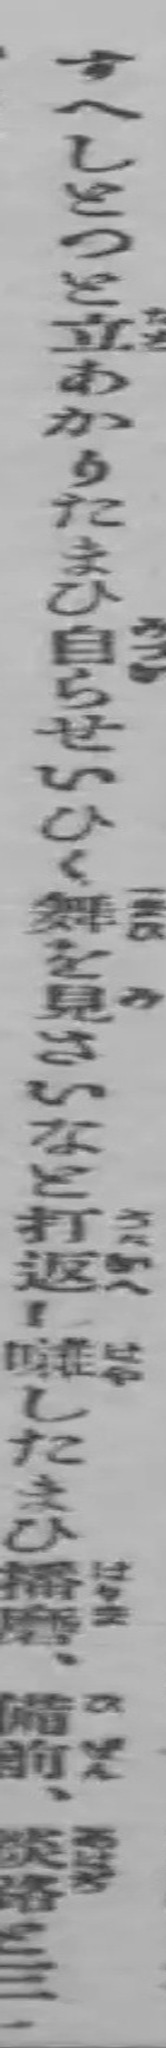すへしとつと立あかりたまひ自らせいひく舞を見さいなと打返し囃したまひ播磨、備前、淡路と三
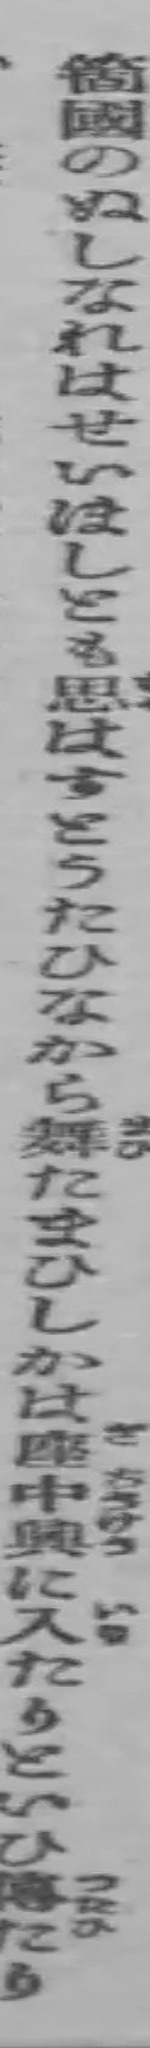箇国のぬしなれはせいほしとも思はすとうたひなから舞たまひしかは座中興に入たりといひ伝たり
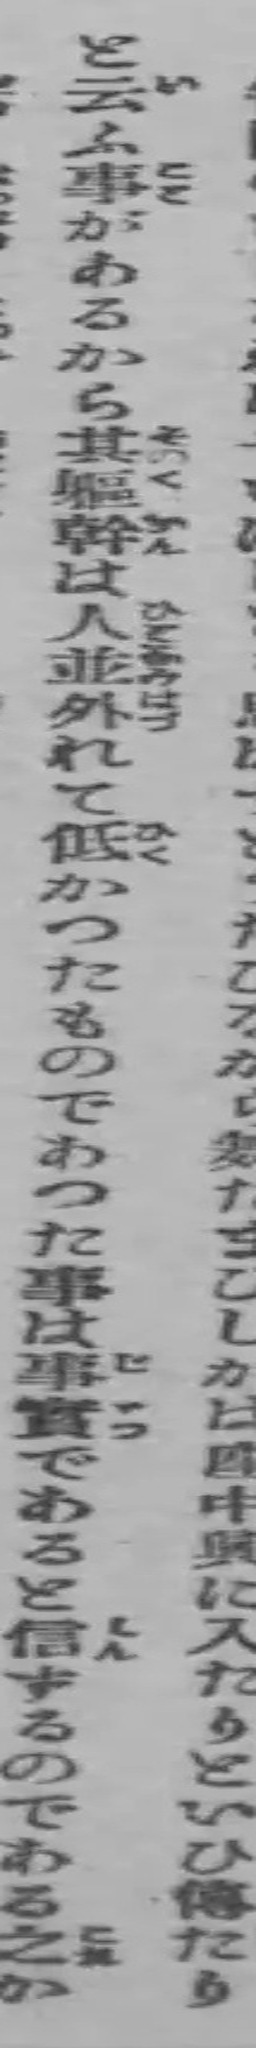と云ふ事があるから其躯幹は人並外れて低かつたものであつた事は事実であると信ずるのである之か
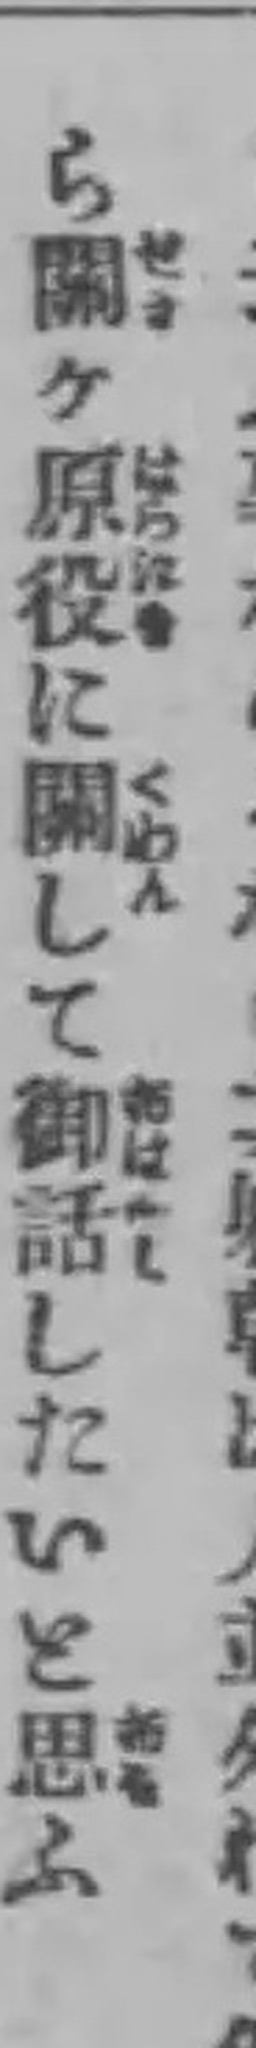ら関ケ原役に関して御話したいと思ふ
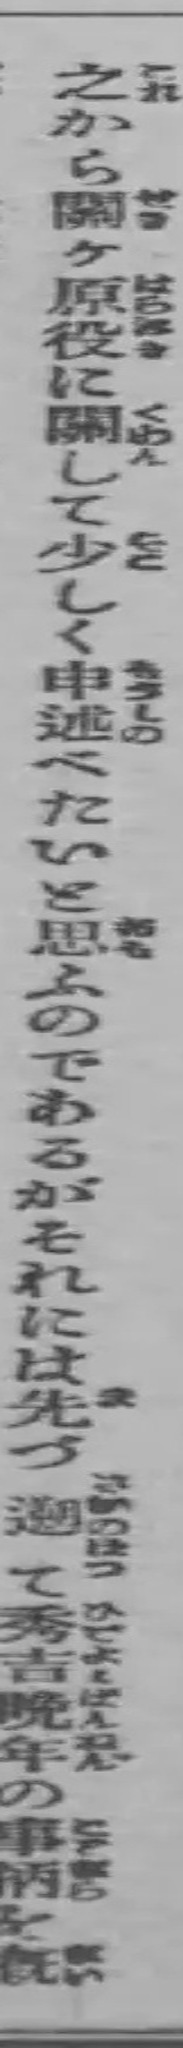之から関ケ原役に関して少しく申述べたいと思ふのであるがそれには先づ遡て秀吉晩年の事柄を概
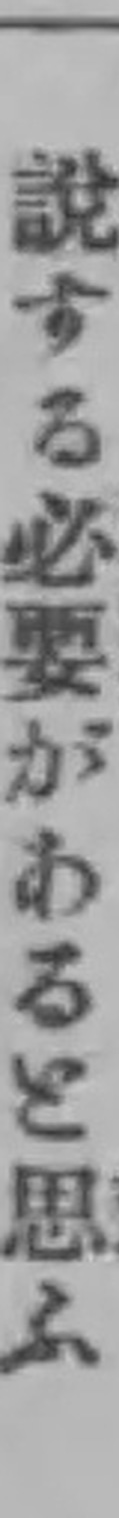説する必要があると思ふ
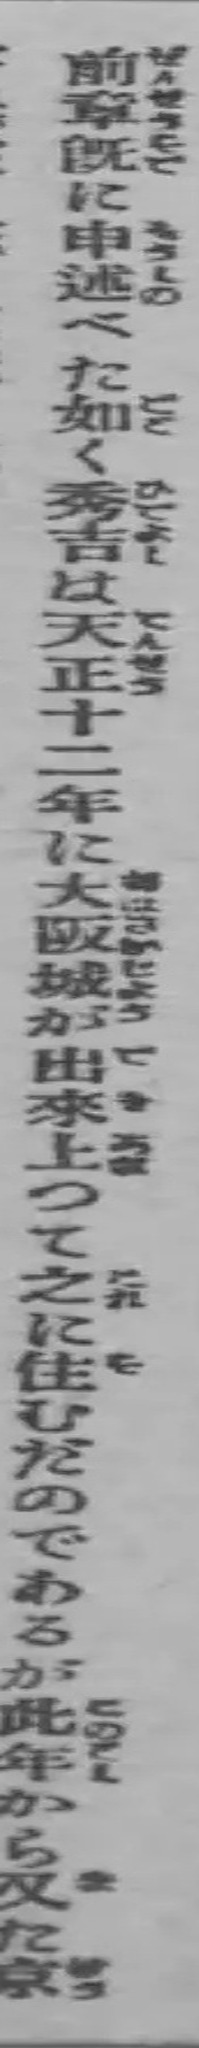秀吉の晩年前章既に申述べた如く秀吉は天正十二年に大阪城が出来上つて之に住むだのであるが此年から又た京
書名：豊橋市史談
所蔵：国立国会図書館 National Diet Library, JAPAN
